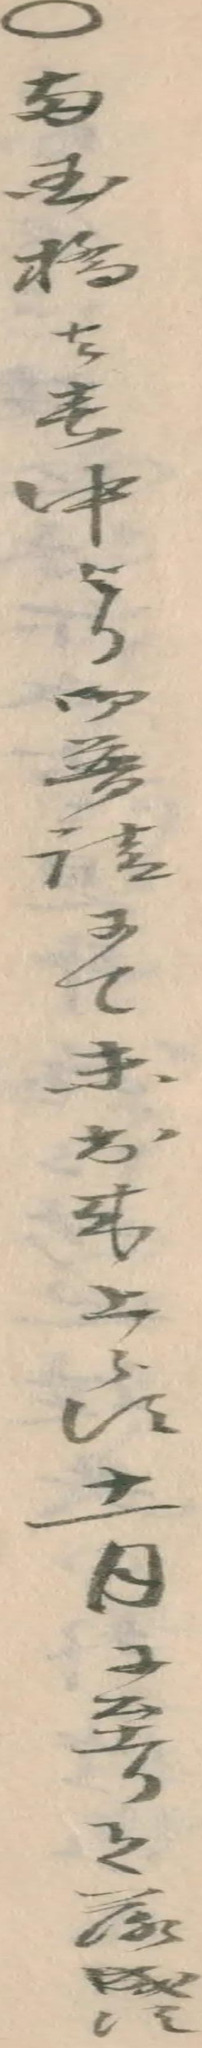〇両国橋は春中より御普請にて未出来上らす十一月に至りて落成す
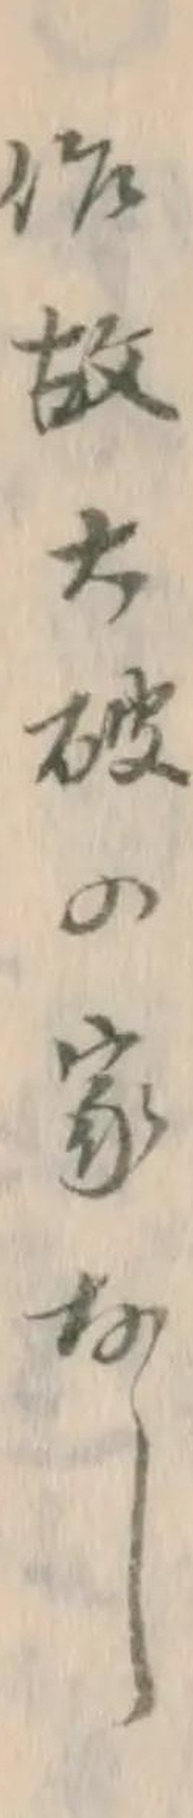作故大破の家なし
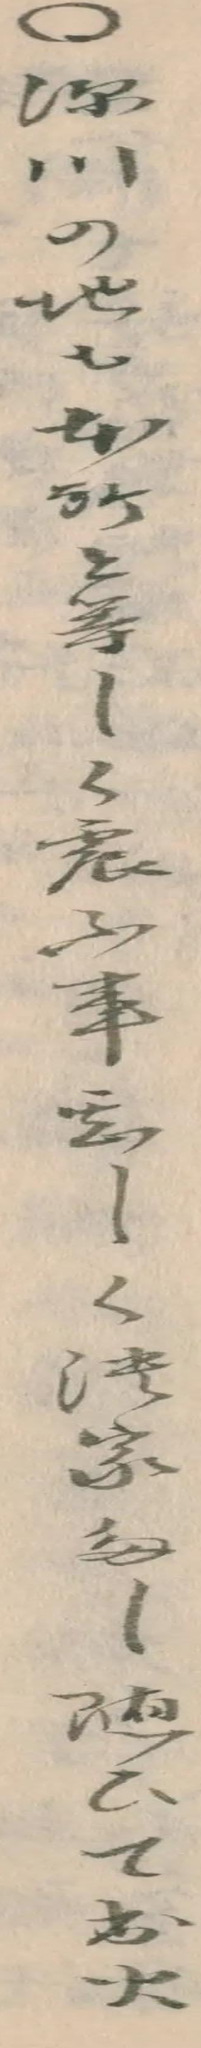〇深川の地も本所と等しく震ふ事甚しく潰家多し随ひて出火
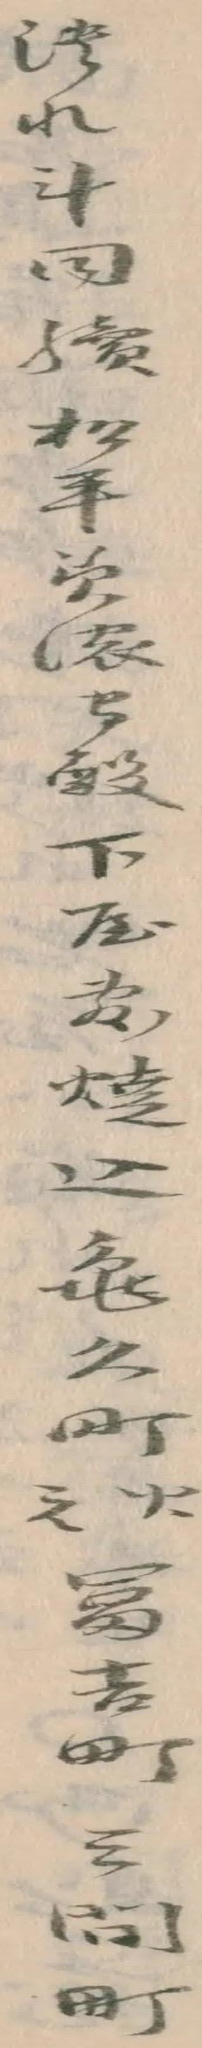潰れ斗同続松平美濃守殿下屋敷焼込亀久町火元冨吉町三間町
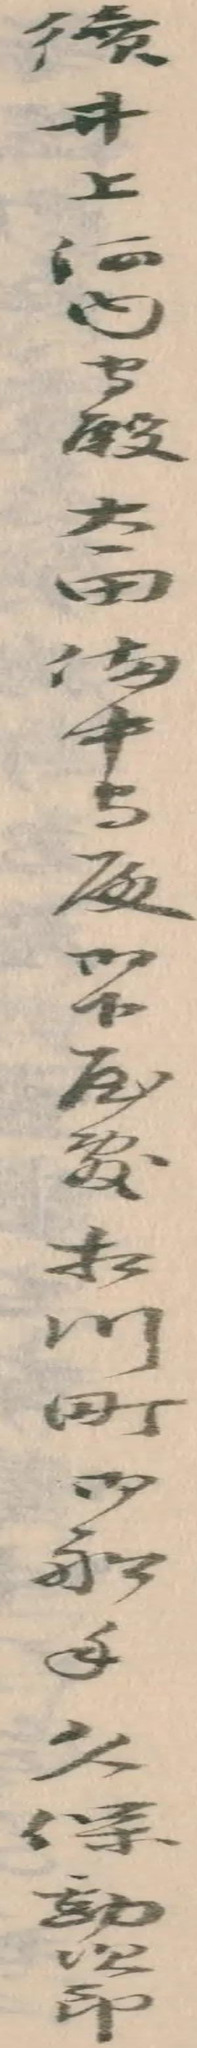続井上河内守殿太田備中守殿御下屋敷相川町御船手久保勘次郎
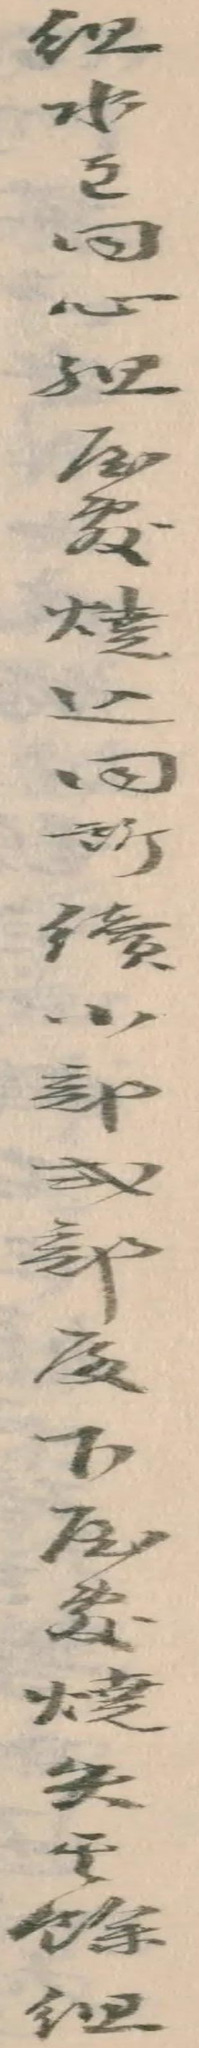組水主同心組屋敷焼込同所続小部式部殿下屋敷焼失其余組
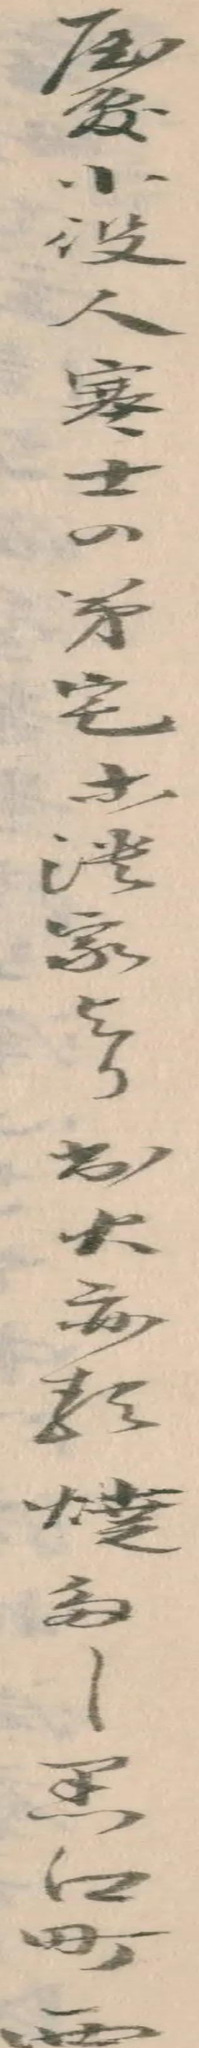屋敷小役人寒士の弟宅等潰家より出火亦類焼多し黒江町西
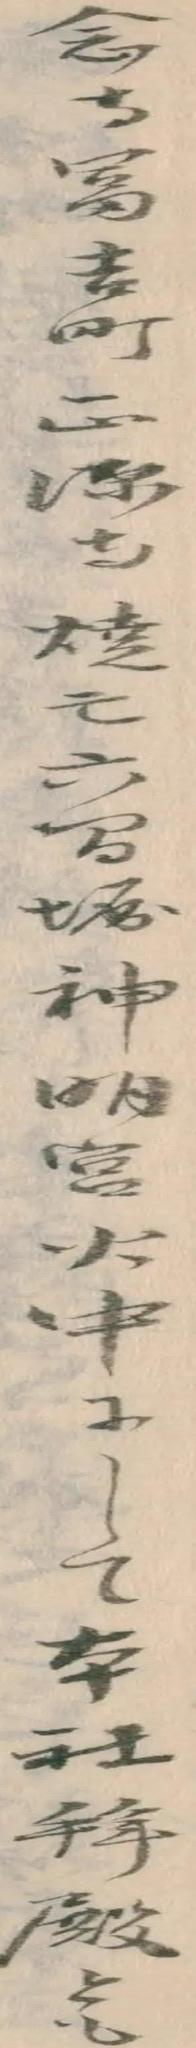念寺冨吉町正源寺焼亡六間堀神明宮火中にして本社拝殿とも
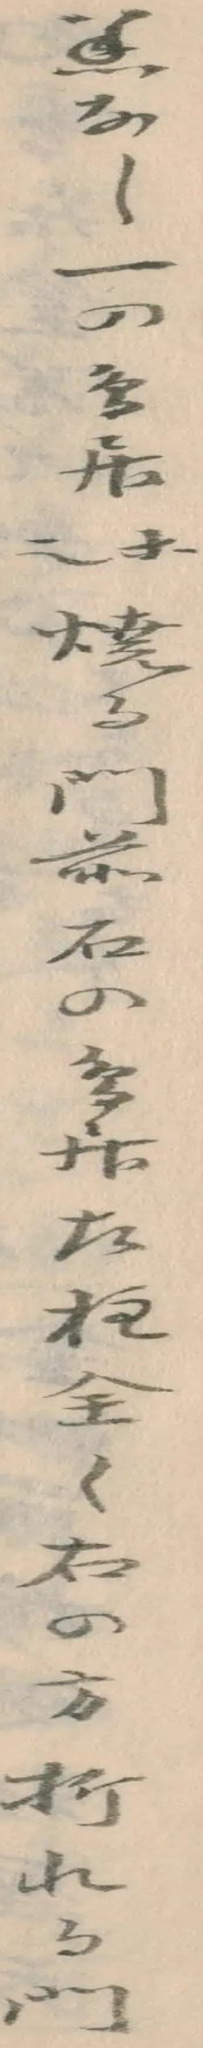恙なし一の鳥居等也焼る門前石の鳥居左柱全く右の方折れる門

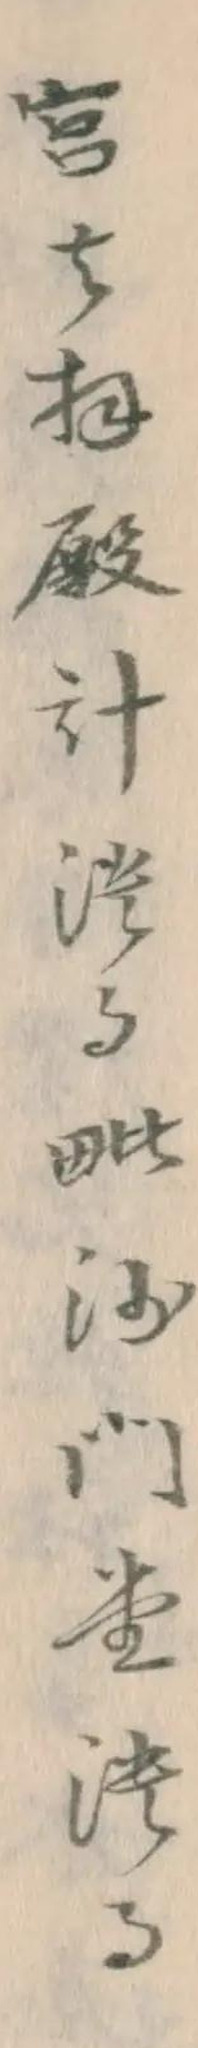宮は拝殿計潰る毘沙門堂潰る
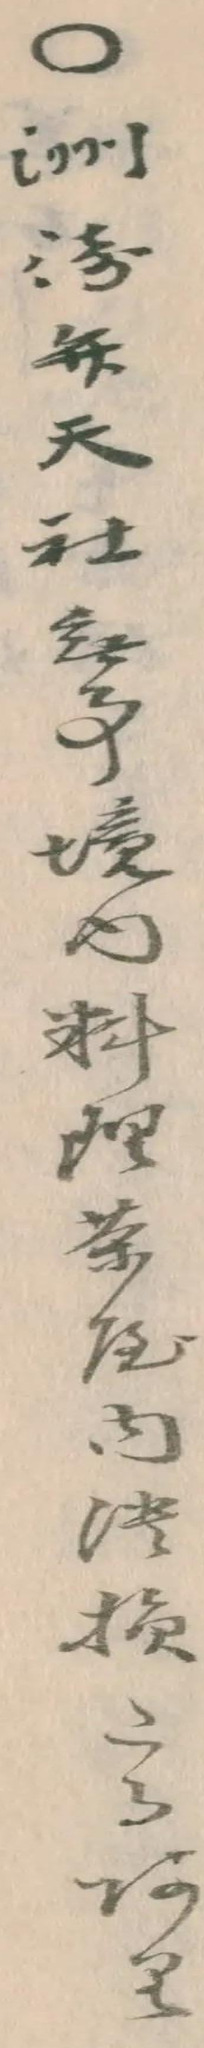〇洲崎弁天社無事境内料理茶屋内潰損たるあり
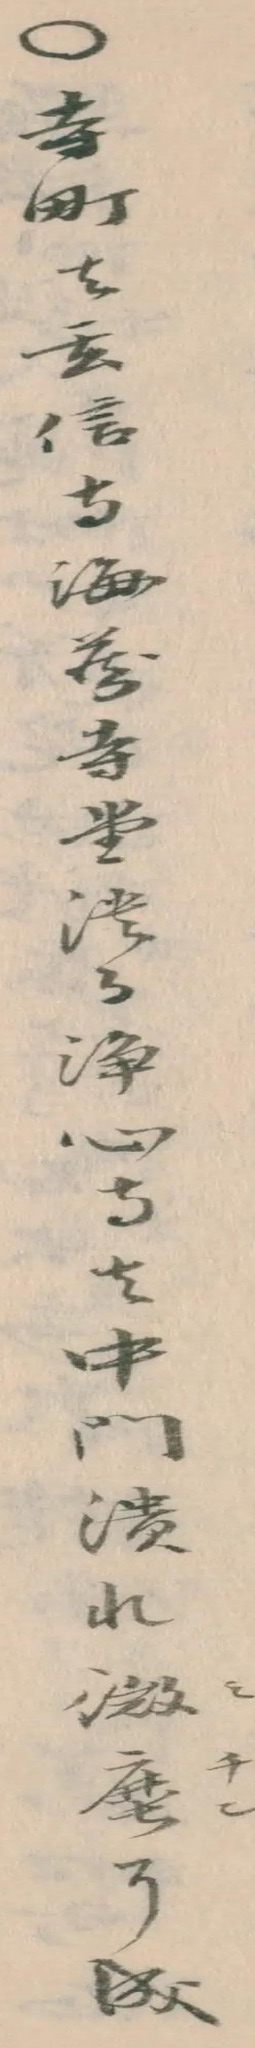〇寺町は玄信寺海蔵寺堂潰る浄心寺は中門潰れ微塵に成
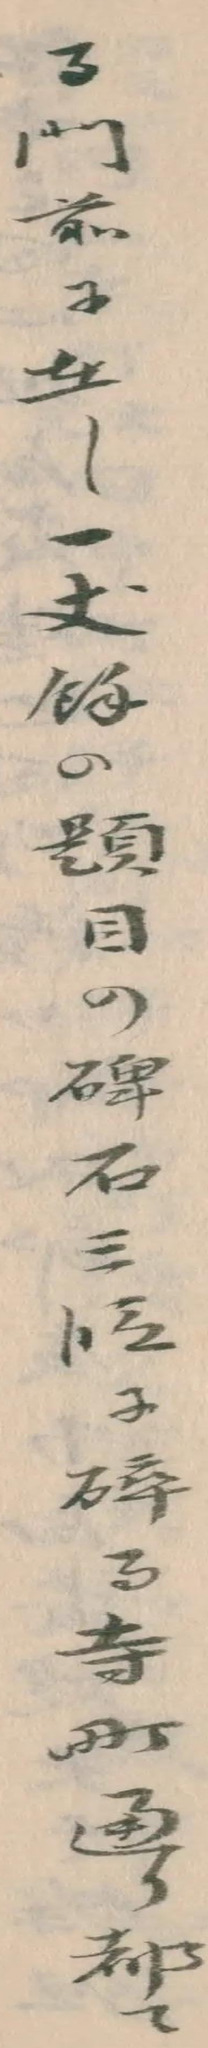る門前に在し一丈余の題目の碑石三段に砕る寺町通り都て
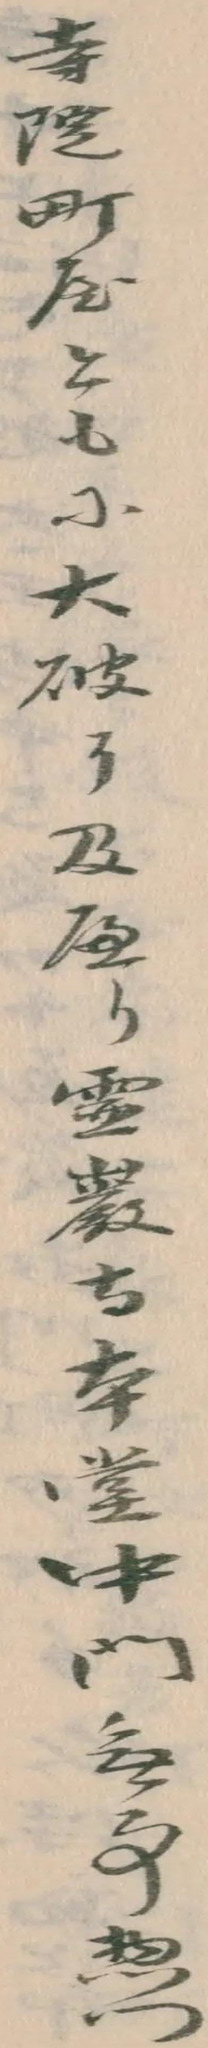寺院町屋ともに大破に及へり霊厳寺本堂中門無事惣門
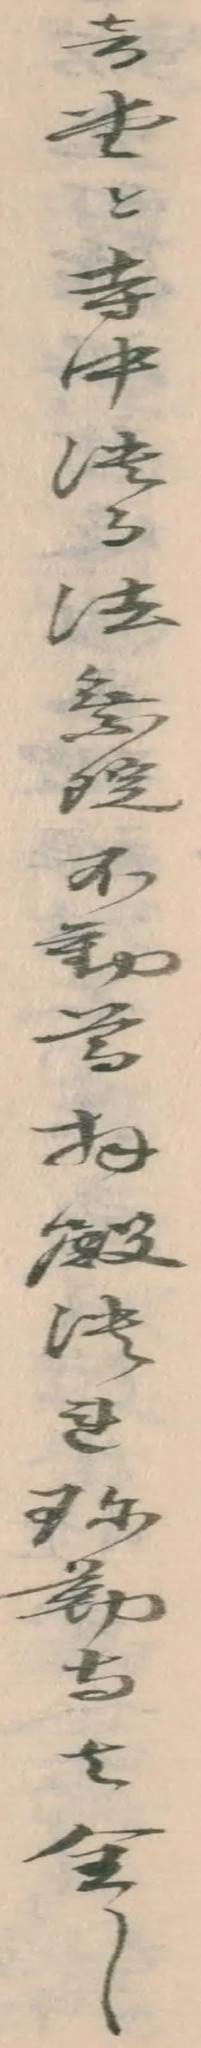音堂と寺中潰る法乗院不動尊拝殿潰れ弥勒寺は全し
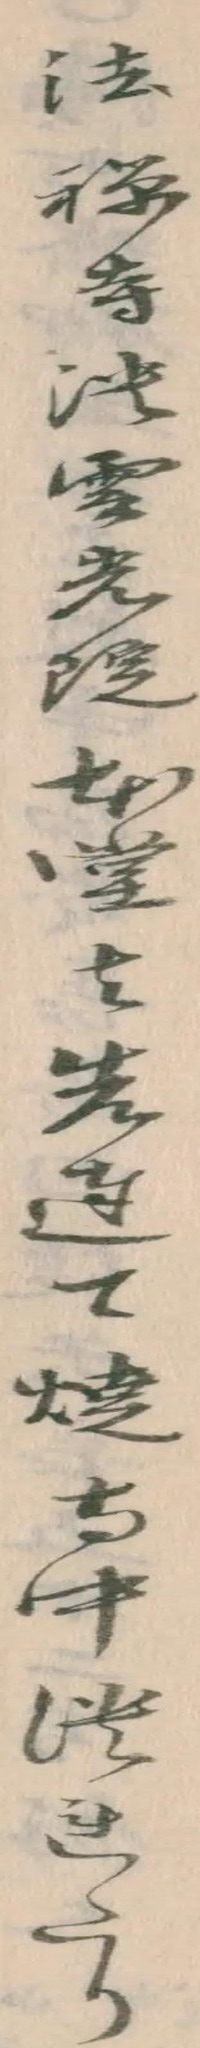法禅寺潰雲光院本堂は先達て焼寺中潰れたり
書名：地災撮要. 巻7-9(地震之部)
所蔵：国立国会図書館 National Diet Library, JAPAN
